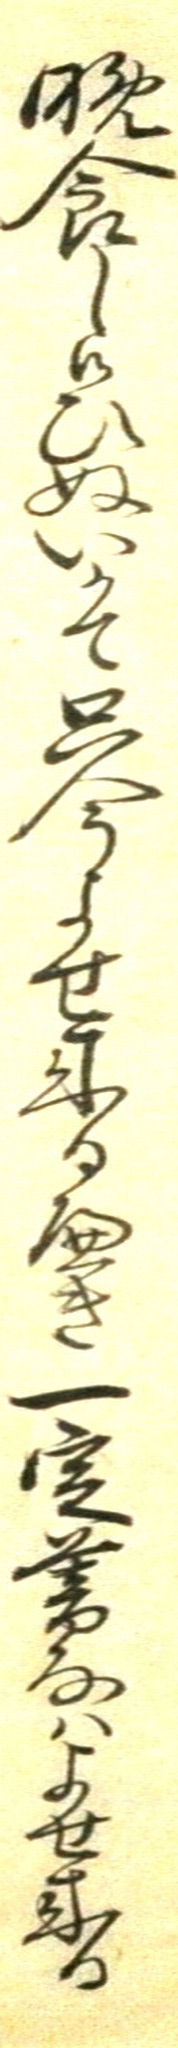晩食し候ひぬいかて只今よせ来るへき一定暮なはよせ来る
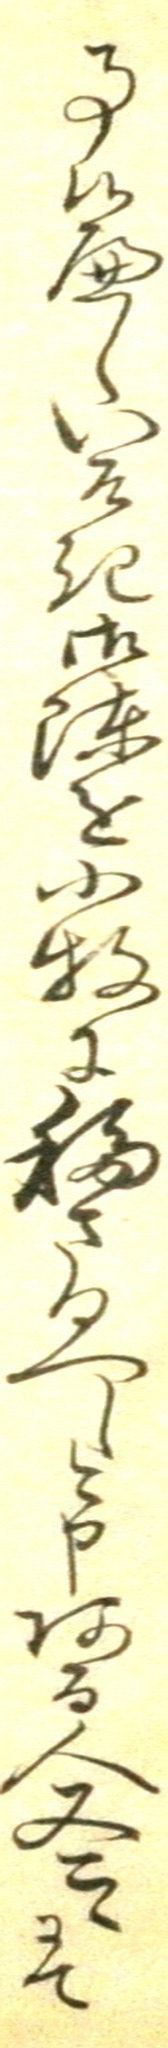事候へしいそき御陣を小牧に移さるへしと申ある人又こゝにて
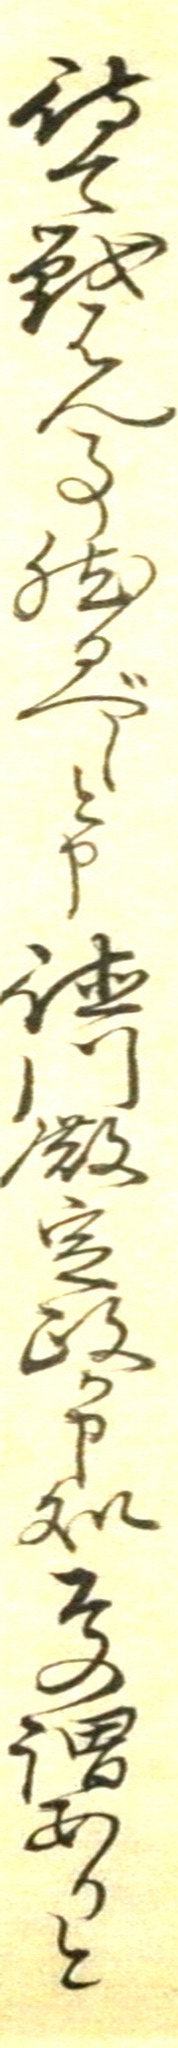待て戦はん事然るべしと申徳川殿定政か申処その謂ありと
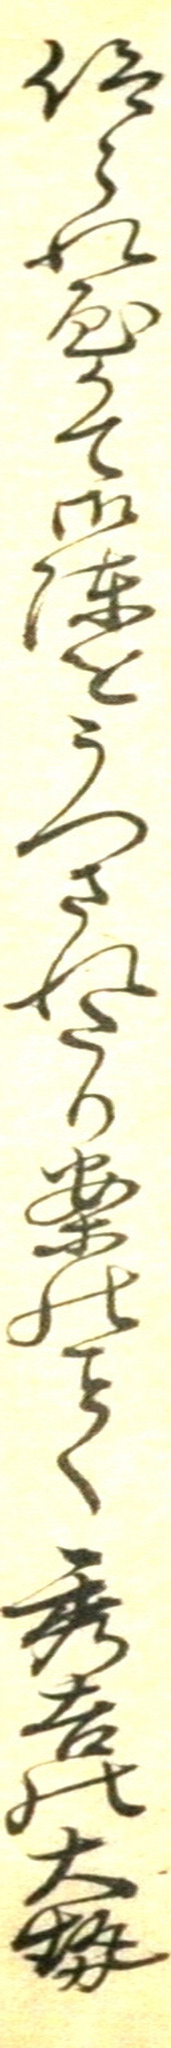仰られやかて御陣をうつされたり案のことく秀吉の大勢
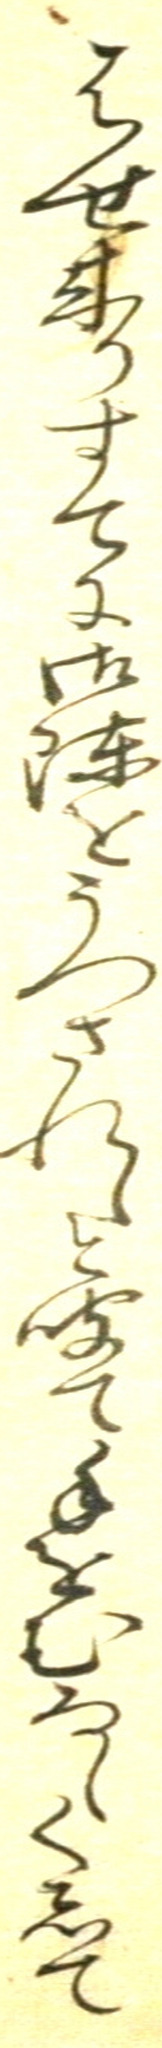はせ来りすてに御陣をうつされしと聞て手をむなしくして
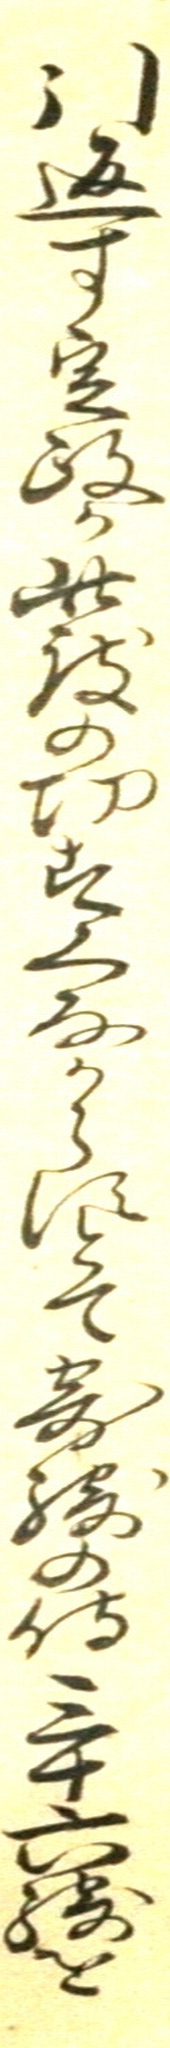引返す定政か此度の功すくなからすとて寄騎の侍三十六騎を
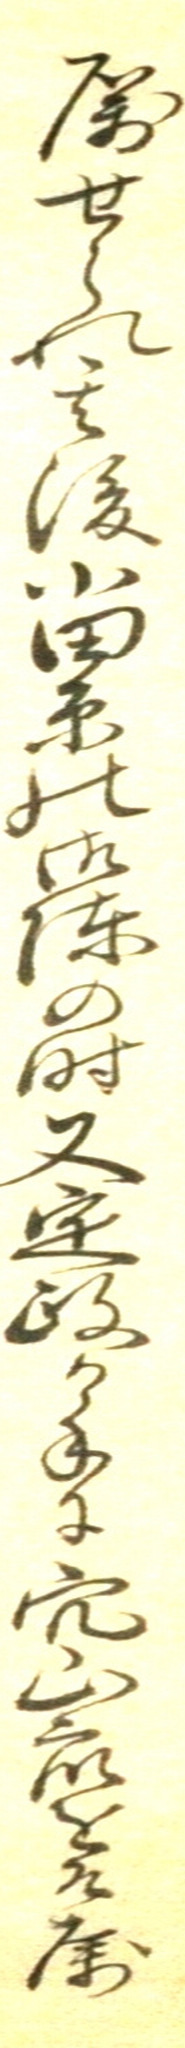属せられ其後小田原の御陣の時又定政か手に穴山衆をそ属
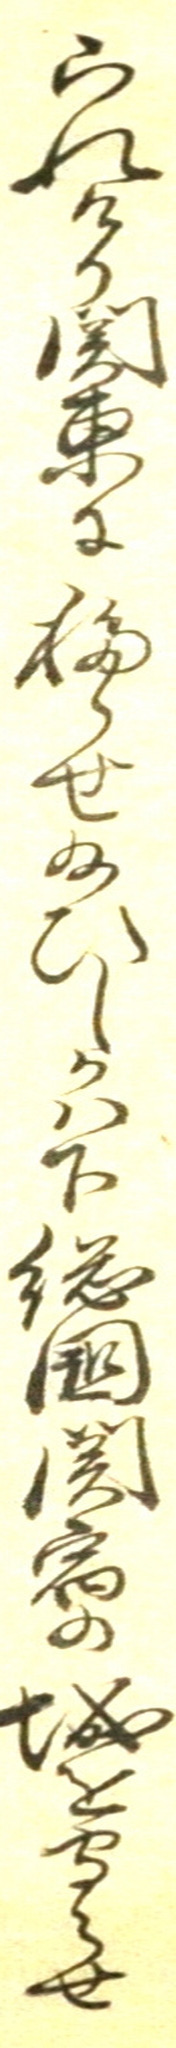られけり関東に移らせ給ひしかは下総国関宿の城を守らせ
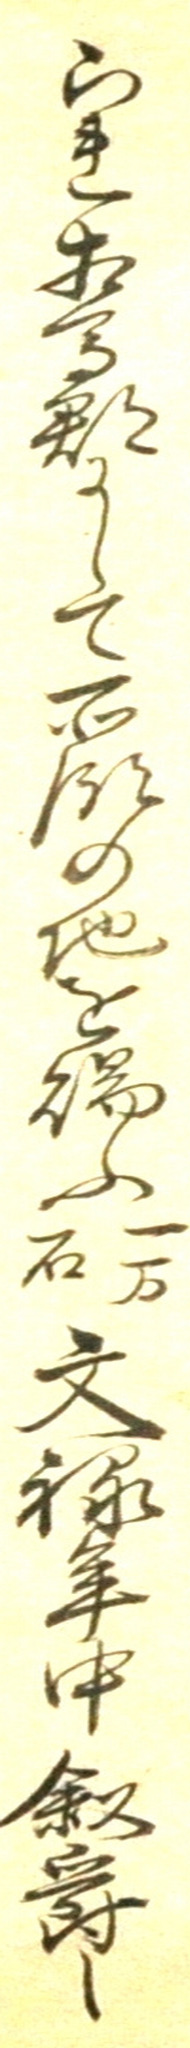られ相馬郡にして所領の地を賜ふ一万石文禄年中叙爵し
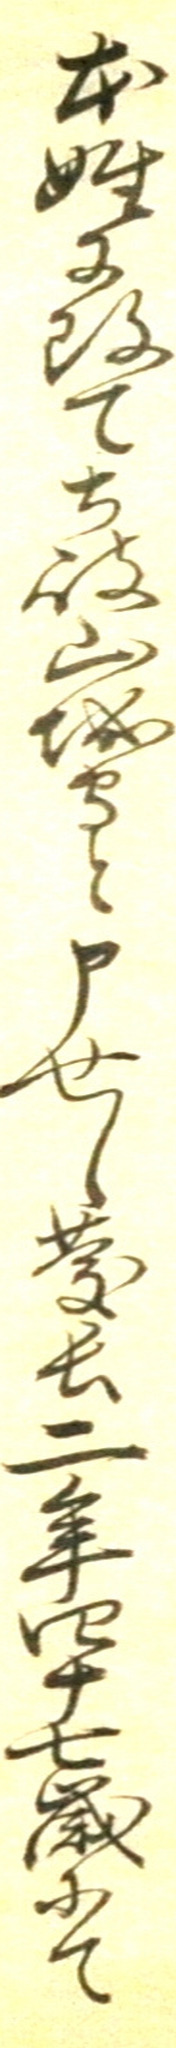本姓に改て土岐山城守と申せし慶長二年四十七歳にて
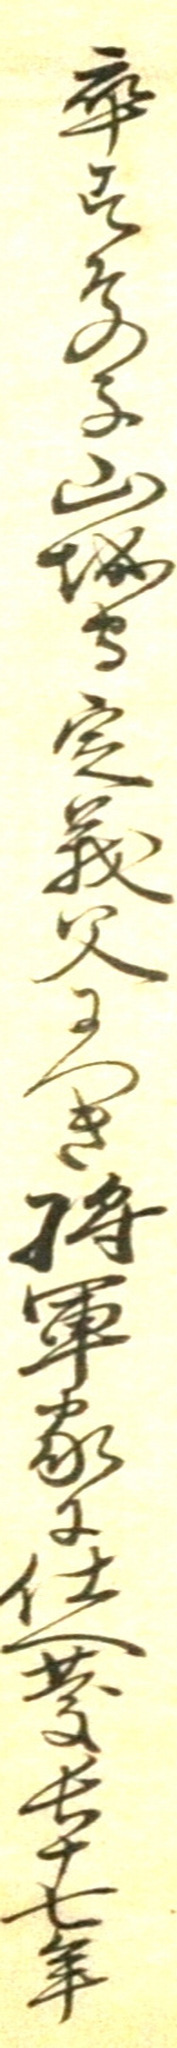卒すその子山城守定羲父につき将軍家に仕へ慶長十七年
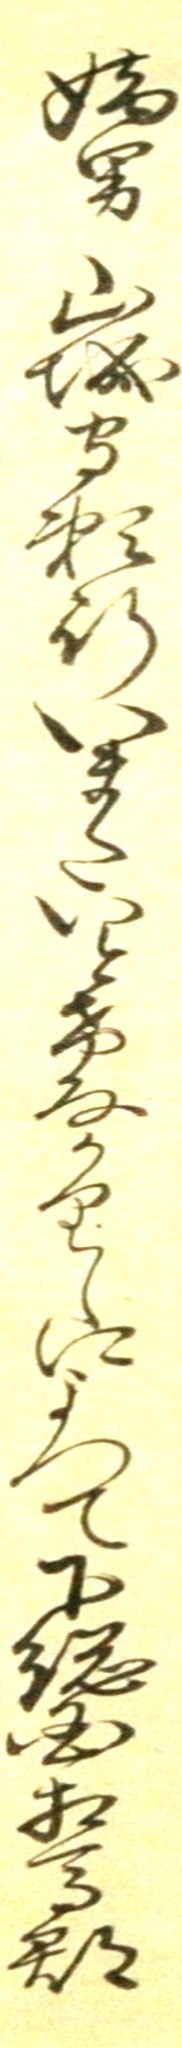嫡男山城守頼行いまたいとけなかりしによつて下総国相馬郡
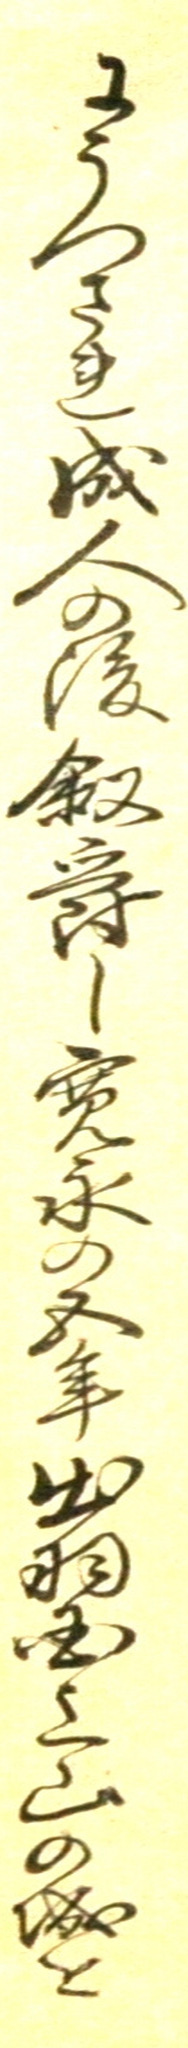にうつされ成人の後叙爵し寛永の五年出羽国上山の城を

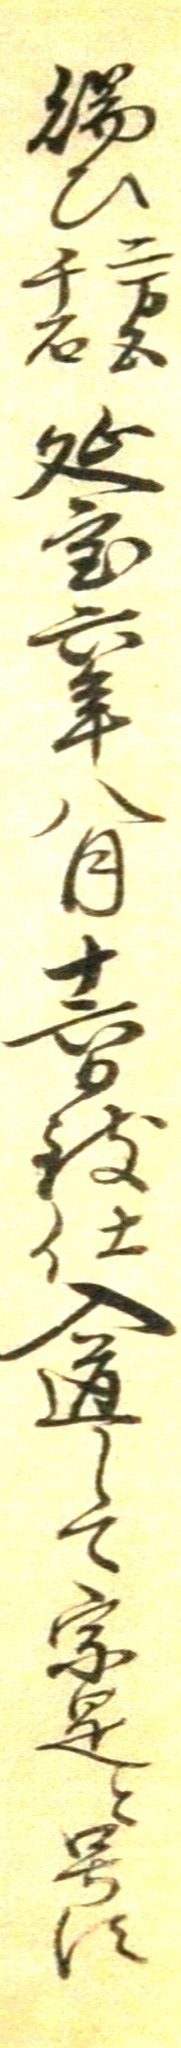賜ひ二万五千石延宝六年八月十六日致仕入道して宗是と号す
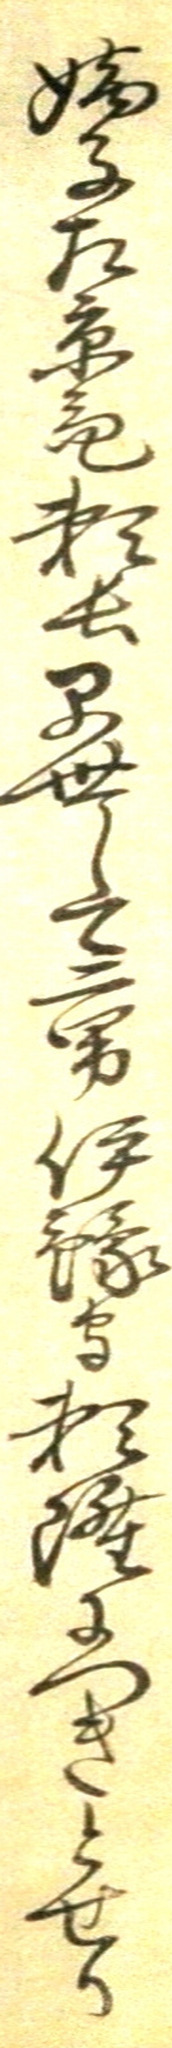嫡子左京亮頼長早世して二男伊予守頼隆につきとせり
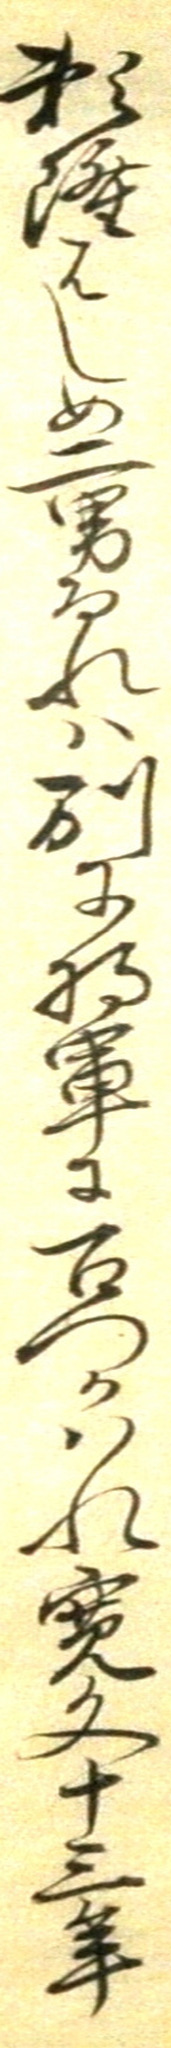頼隆はしめ二男なれは別に将軍に召つかはれ寛文十三年
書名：藩翰譜（四・下）
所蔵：伊那市立高遠町図書館・合同会社AMANE
